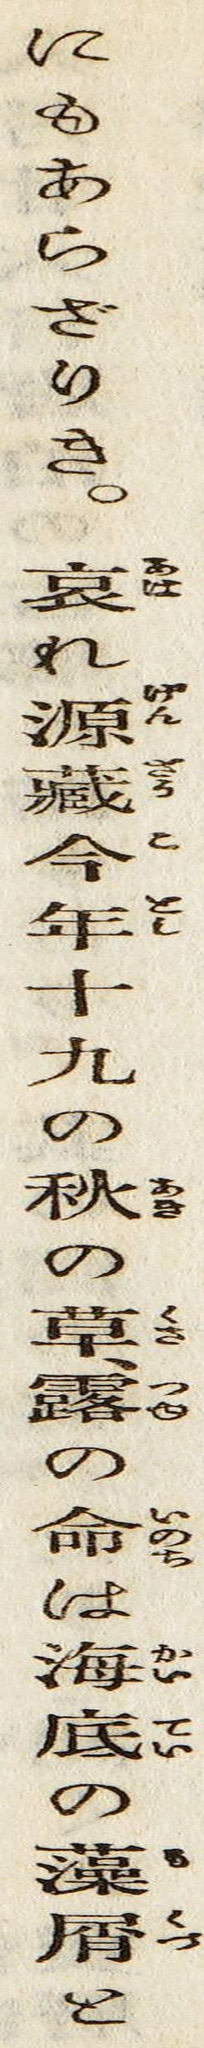にもあらざりき。哀れ源蔵今年十九の秋の草、露の命は海底の藻屑と
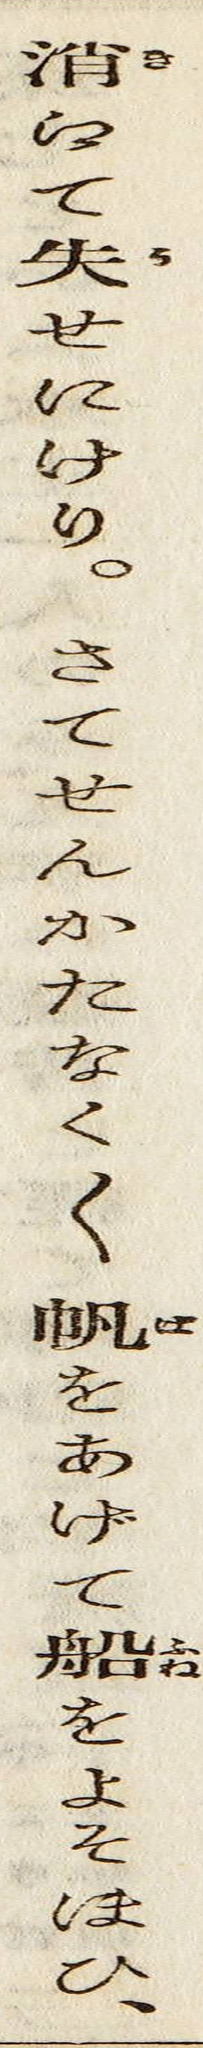消えて失せにけり。さてせんかたなく〳〵帆ぱをあげて船をよそほひ、
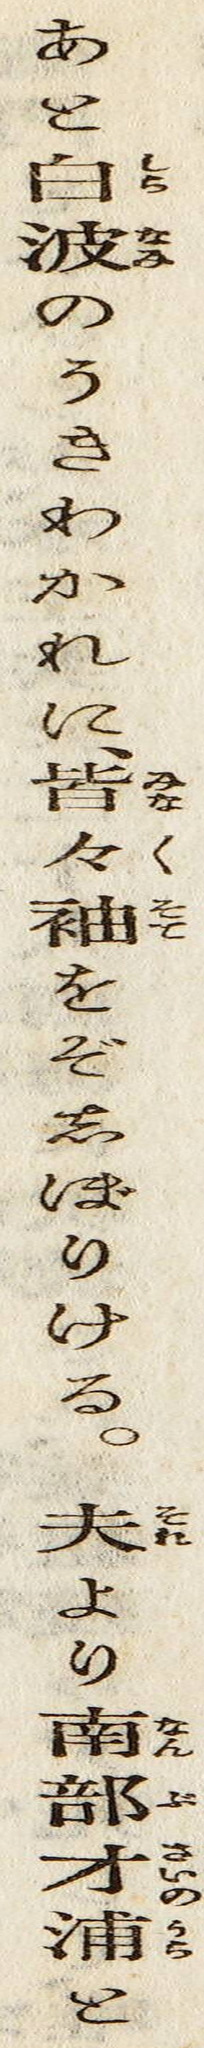あと白波のうきわかれに、皆々袖をぞしぼりける。夫より南部才浦と
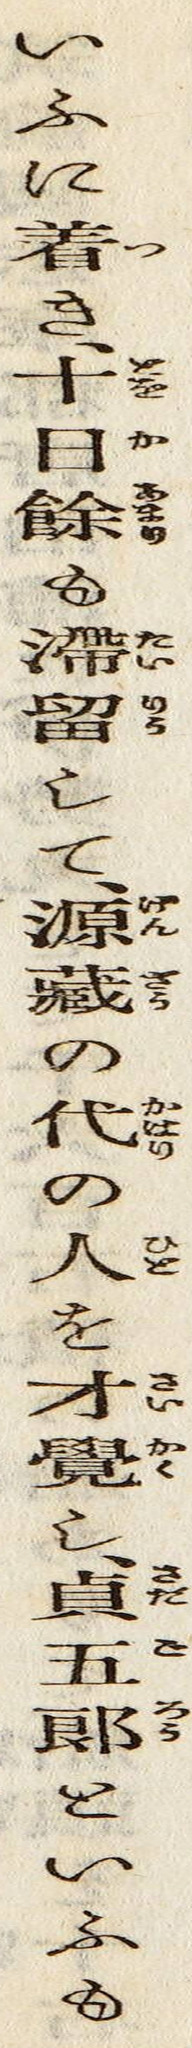いふに着き、十日余も滞留して、源蔵の代の人を才覚し、貞五郎といふも
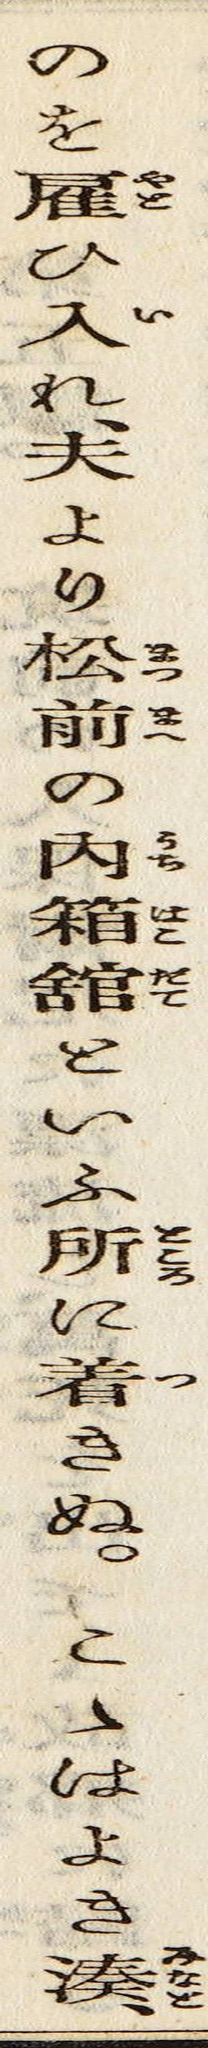のを雇ひ入れ、夫より松前の内箱館といふ所に着きぬ。こゝはよき湊、
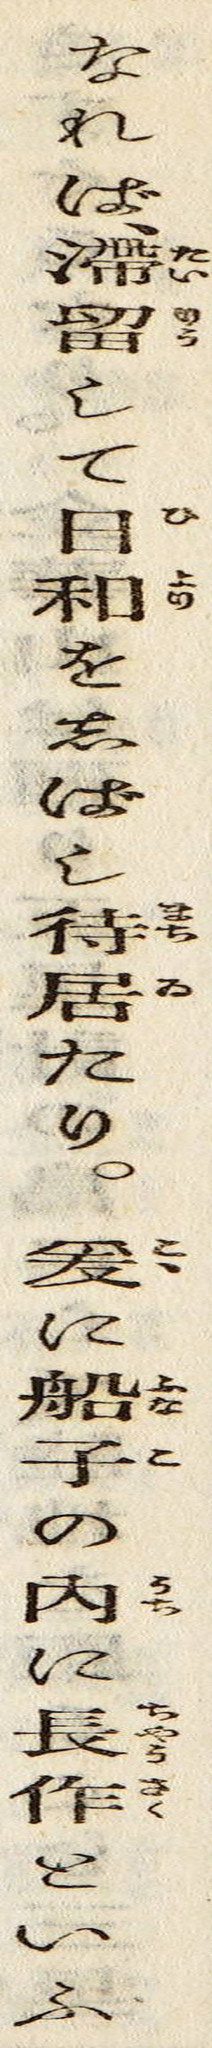なれば、滞留して日和をしばし待居たり。爰に船子の内に長作といふ
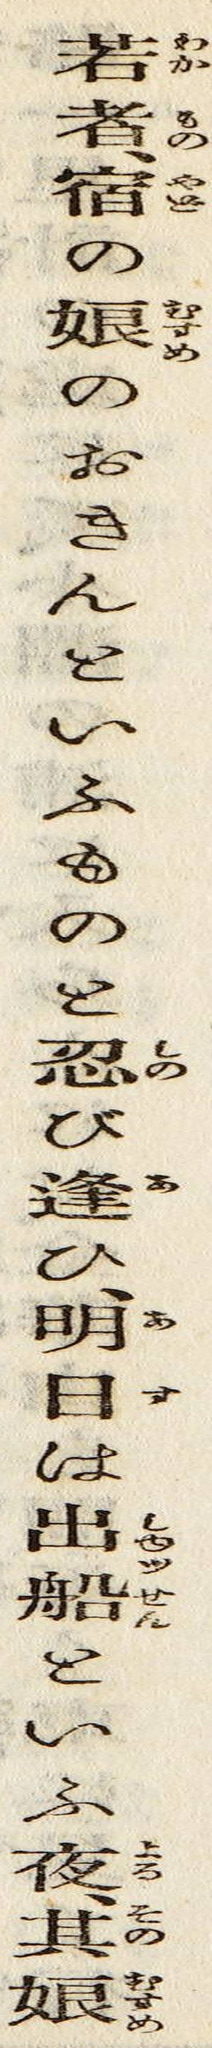若者、宿の娘のおきんといふものと忍び逢ひ、明日は出船といふ夜、其娘
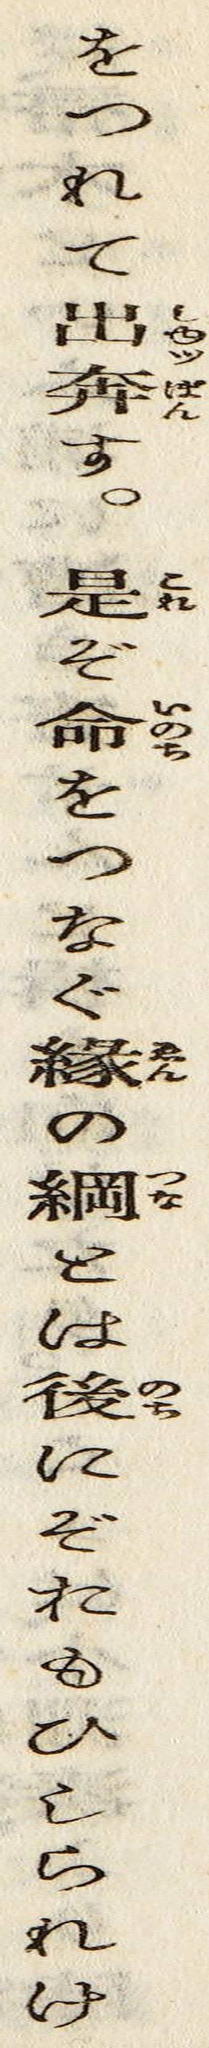をつれて出奔す。是ぞ命をつなぐ緣の綱とは後にぞおもひしられけ
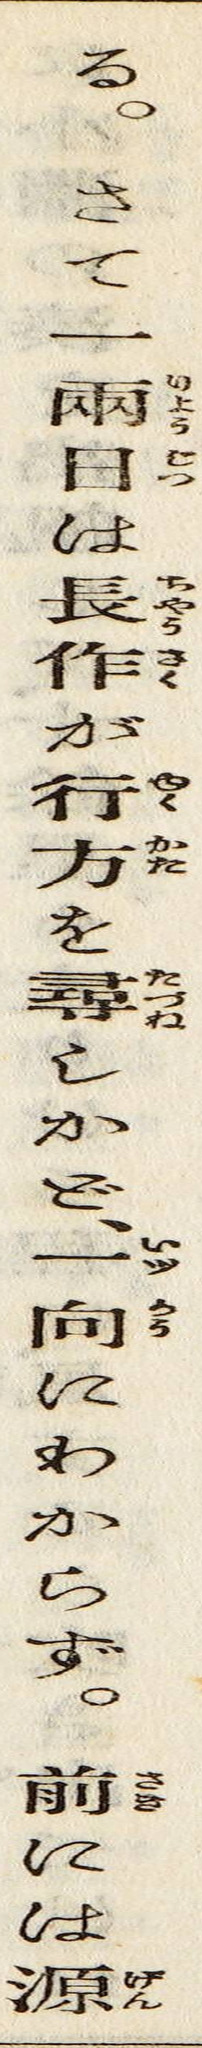る。さて一両日は長作が行方を尋しかど、一向にわからず。前には源
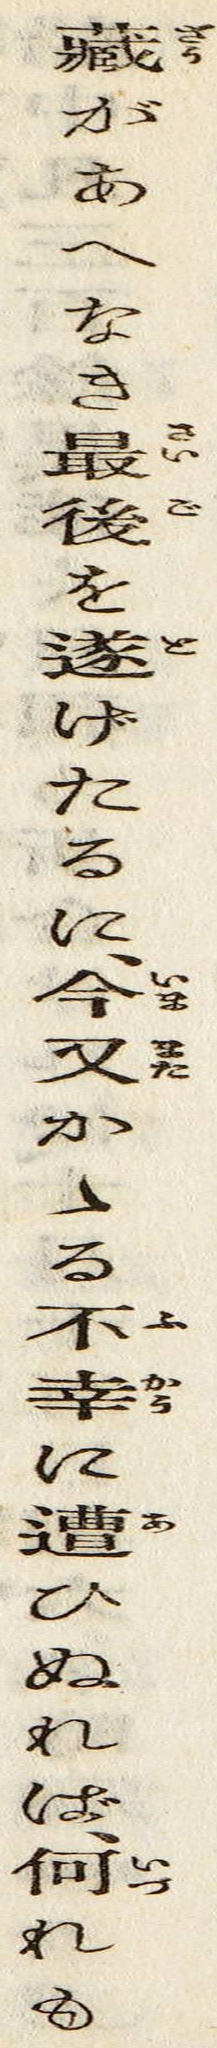蔵があへなき最後を遂げたるに、今又かゝる不幸に遭ひぬれば、何れも
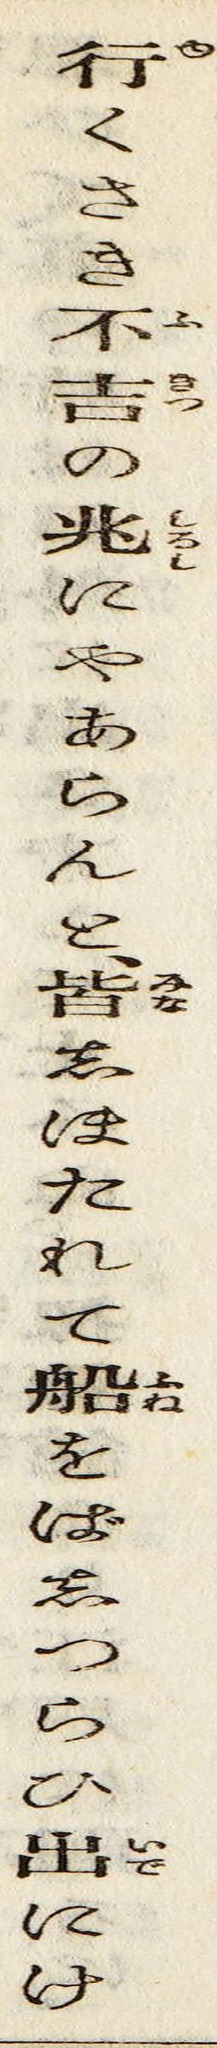行くさき不吉の兆にやあらんと、皆しほたれて船をばしつらひ出にけ
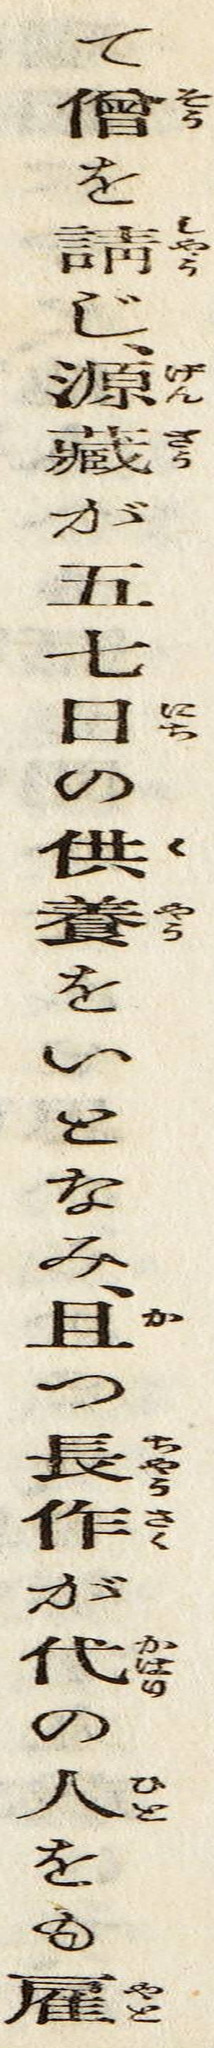て僧を請じ、源蔵が五七日の供養をいとなみ、且つ長作が代の人をも雇
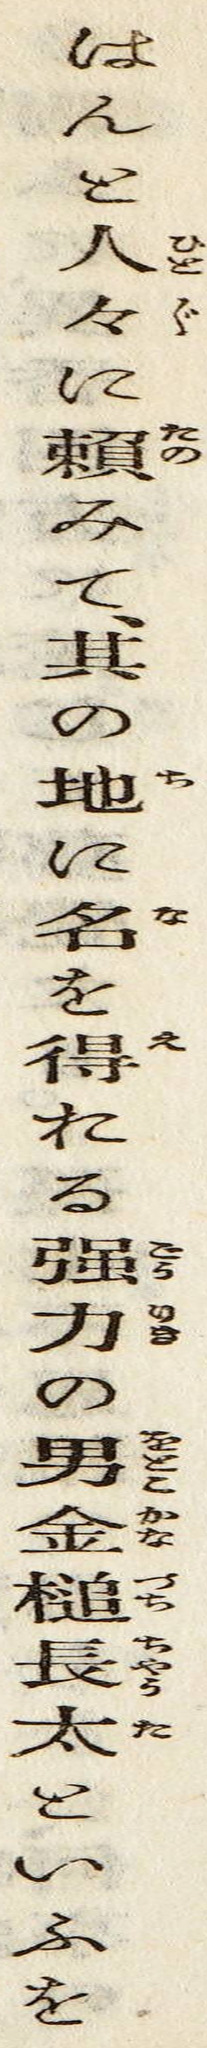はんと人々に頼みて、其の地に名を得おる強力の男金槌長太といふを
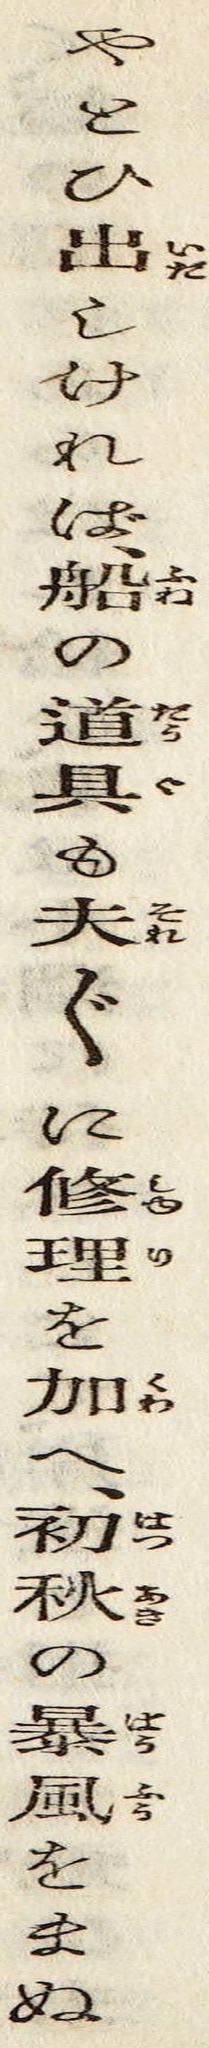やとひ出しければ、船の道具も夫〴〵に修理を加へ、初秋の暴風をまぬ
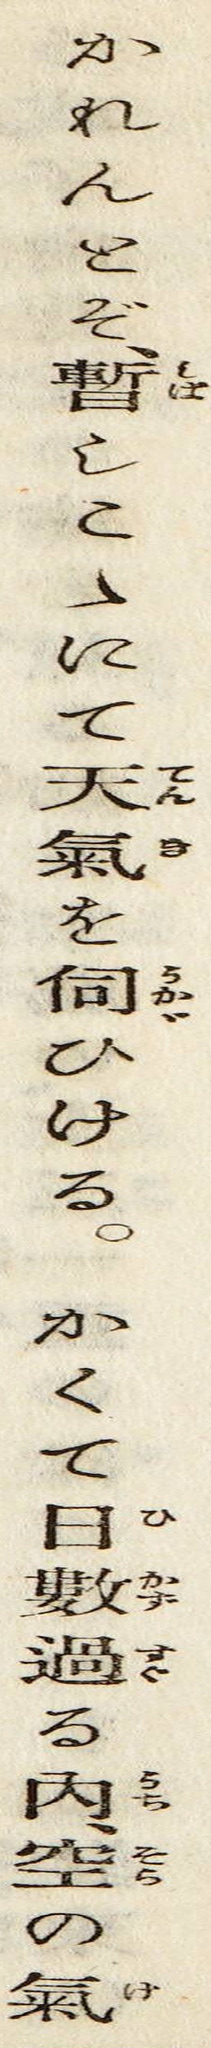かれんとぞ、暫しこゝにて天気を伺ひける。かくて日数過る内、空の気

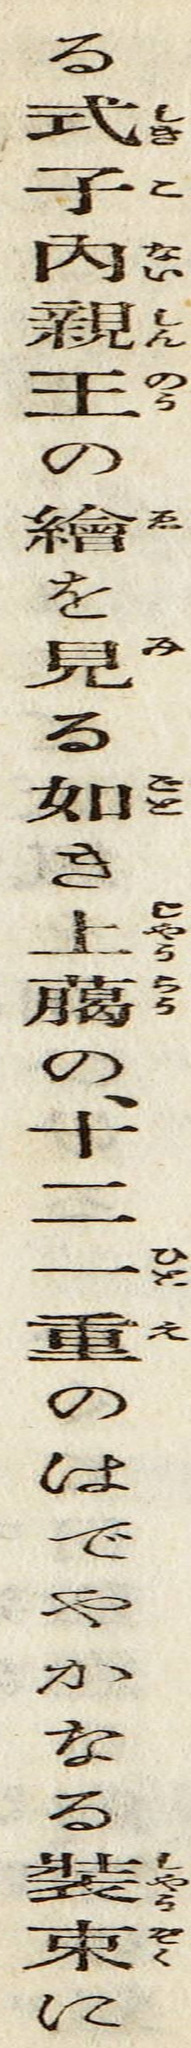る式子内親王の絵を見る如き上﨟の、十二一重のはでやかなる装束に
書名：日本漂流譚
